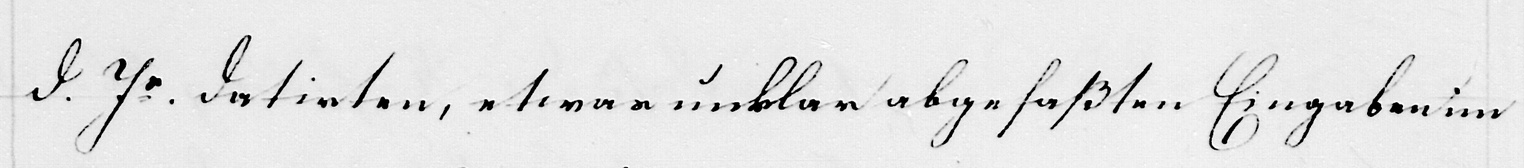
d. Js. datirten, etwas unklar abgefaßten Eingaben im
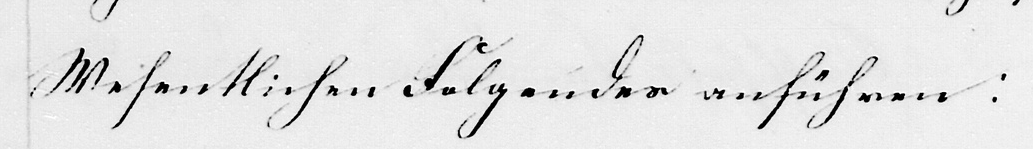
Wesentlichen Folgendes anführen:
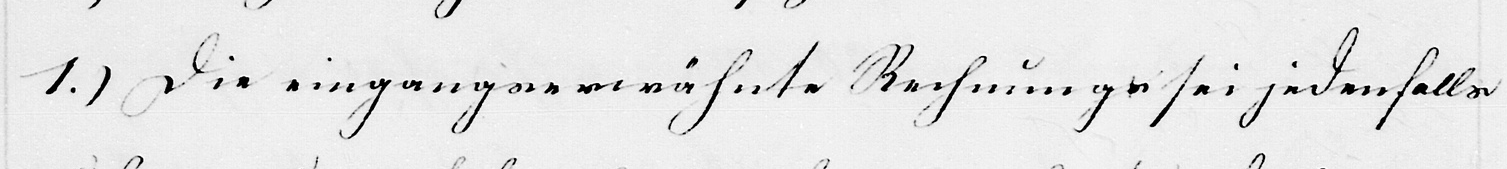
1.) Die eingangserwähnte Rechnung sei jedenfalls
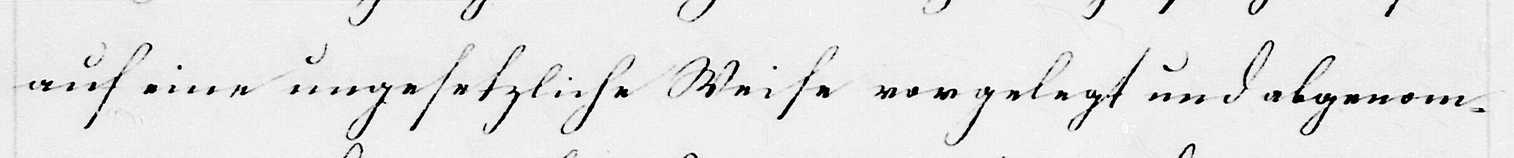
auf eine ungesetzliche Weise vorgelegt und abgenom¬
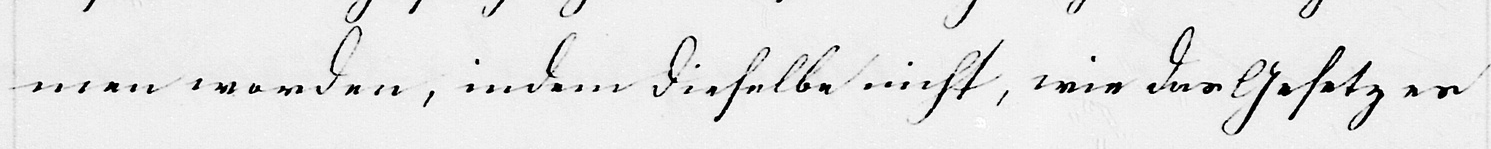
men worden, indem dieselbe nicht, wie das Gesetz es
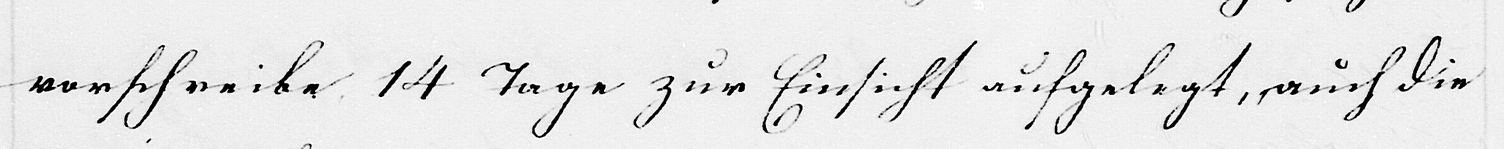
vorschreibe 14 Tage zur Einsicht aufgelegt, auch die
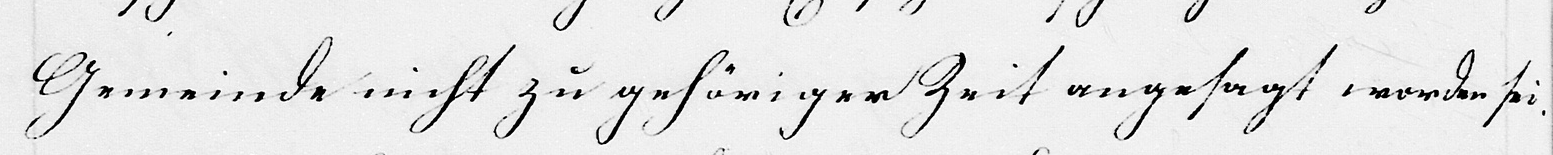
Gemeinde nicht zu gehöriger Zeit angesagt worden sei.
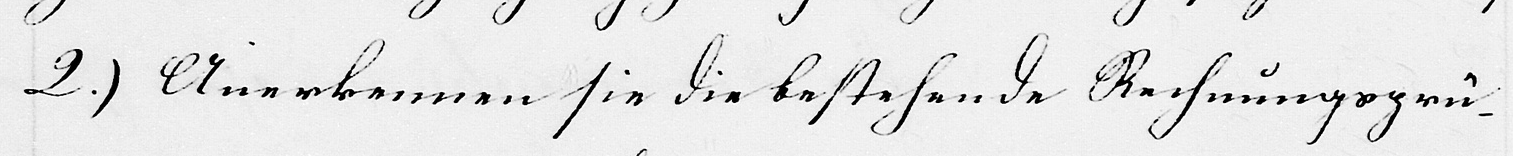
2.) Anerkennen sie die bestehende Rechnungsprü¬
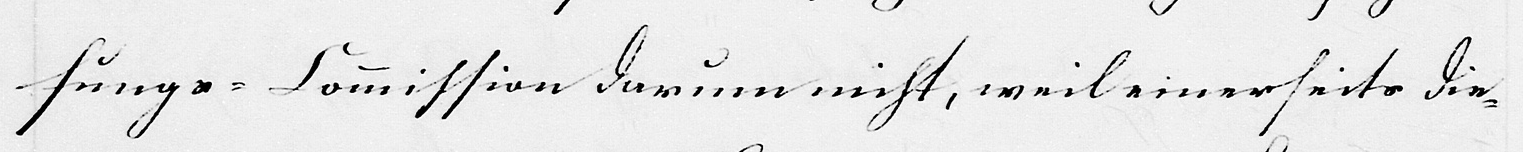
fungs-Commission darum nicht, weil einerseits die¬
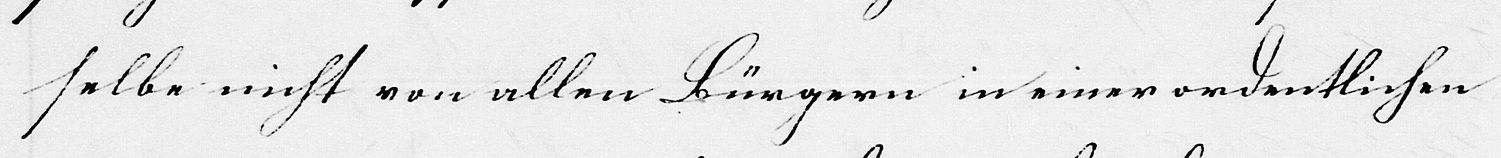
selbe nicht von allen Bürgern in einer ordentlichen
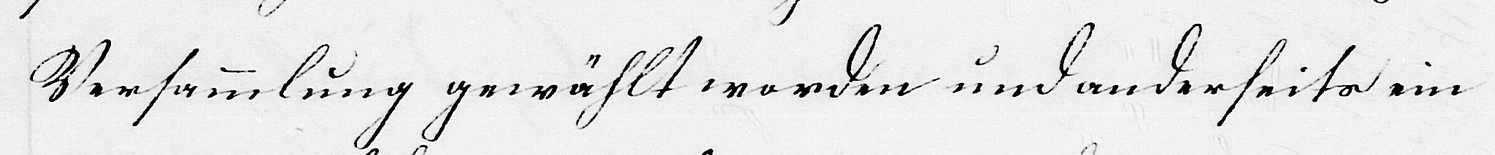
Versammlung gewählt worden und anderseits ein
